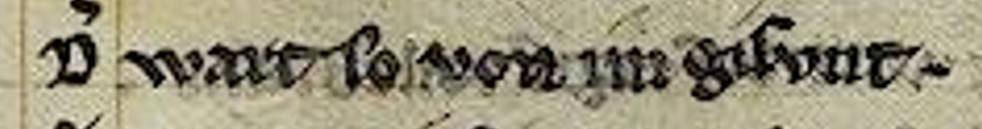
D(er) wart ſo von im geſvnt.
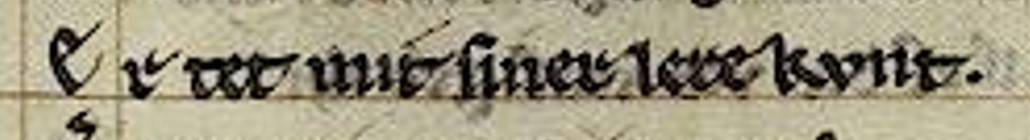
Er tet mit ſiner lere kvnt.
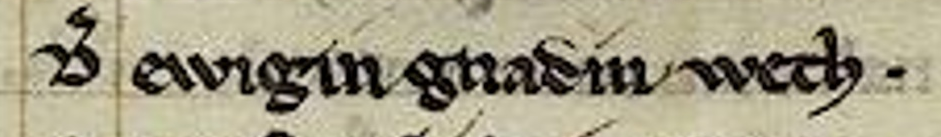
D(er) ewigin gnadin wech.
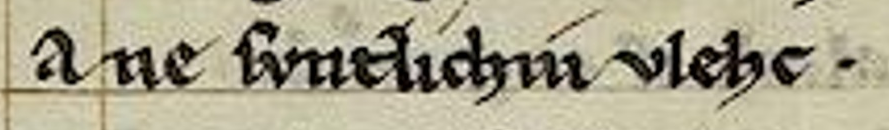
Ane ſvntlichin vlehc.
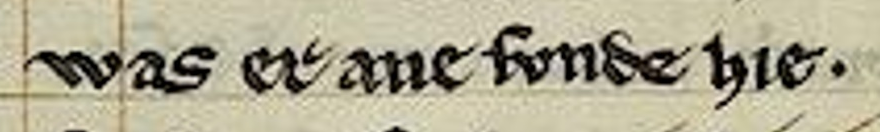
was er ane ſvnde hie.
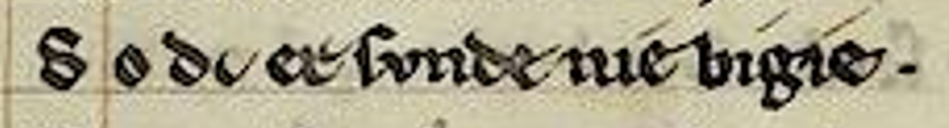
So d(az) er ſvnde nie bigie.
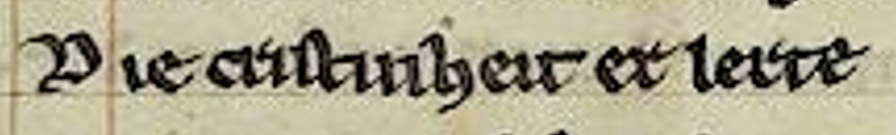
Die criſtinheit er lerte.
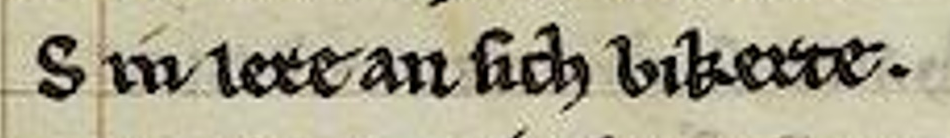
Sin lere an ſich bikerte.
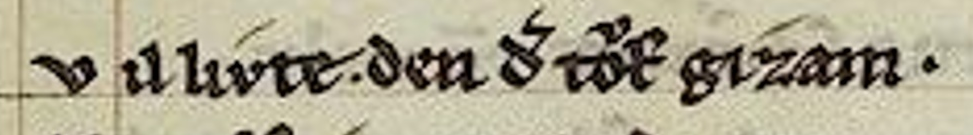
Vil livte. den d(er) to°vf gizam.
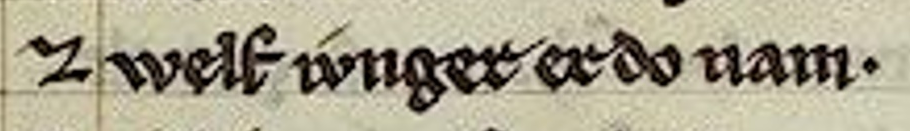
Zwelf ivnger er do nam.
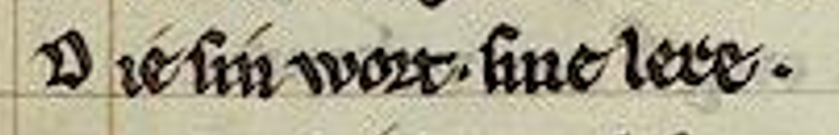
Die ſin wort. ſine lere.
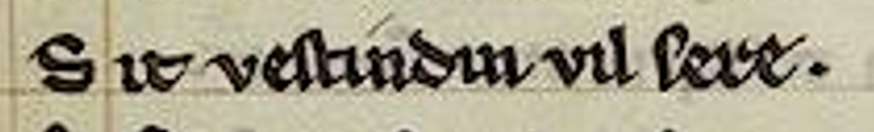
Sit veſtindin vil ſere.
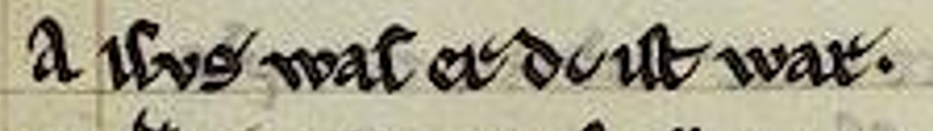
Alſvs waſ er d(az) iſt war.
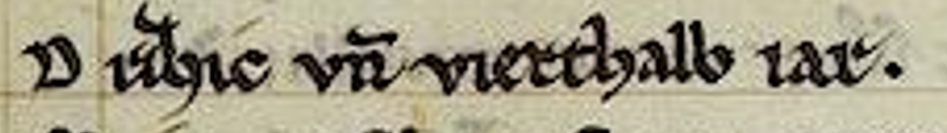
Dri?ic vn(d) vierthalb iar.
